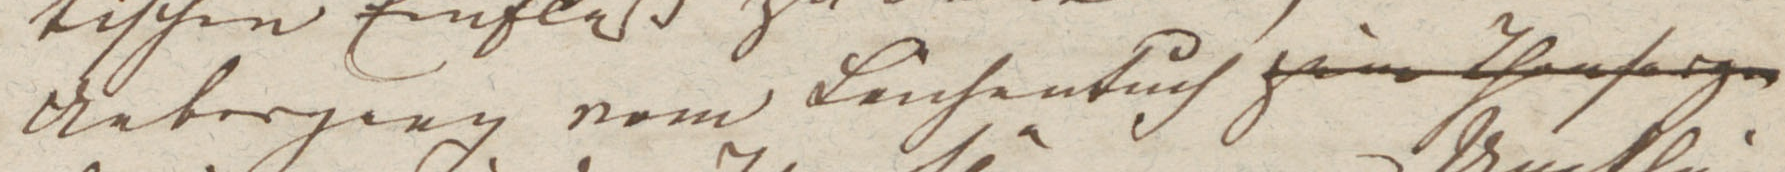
Uebergang vom Leichentuch zum Thonsarge
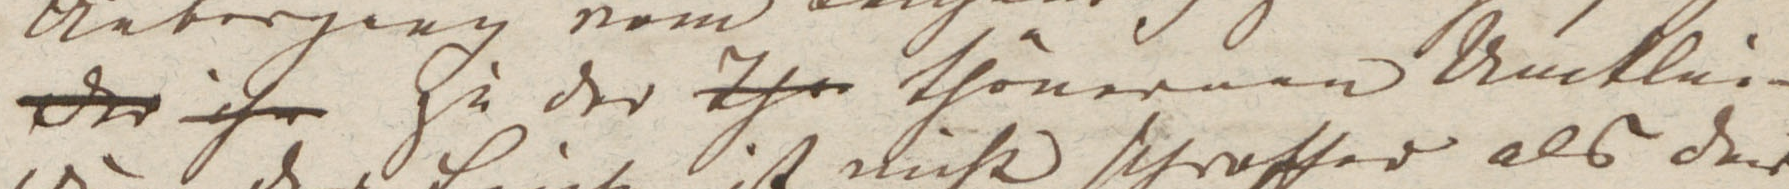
der ihn zu der Tho thönernen Umklei-
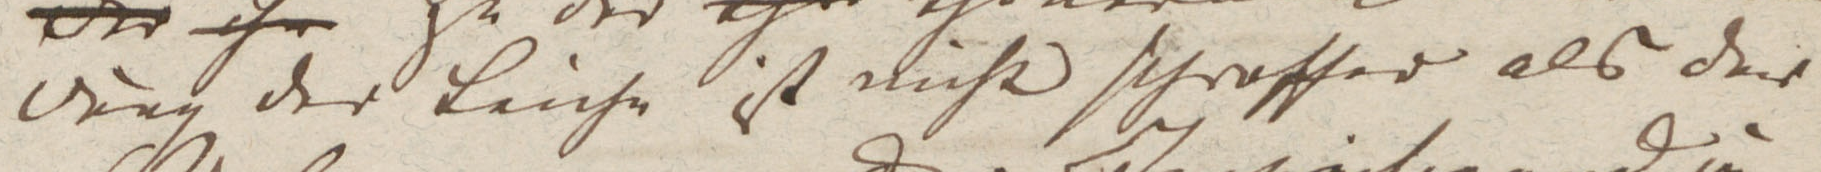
dung der Leiche ist nicht schroffer als der
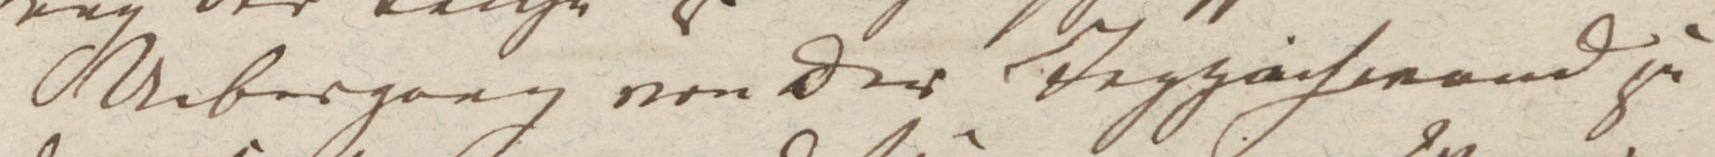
Uebergang von der Teppichwand zu
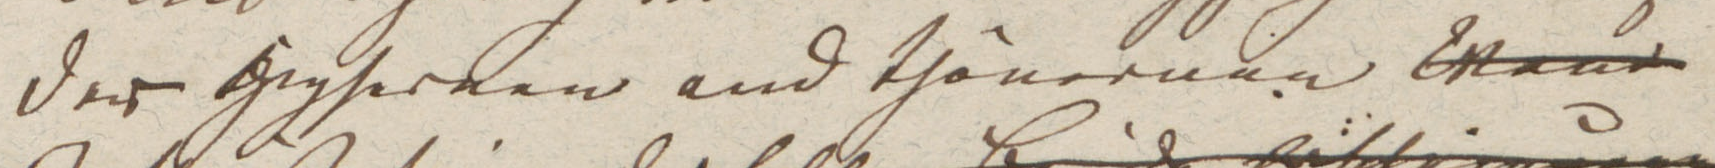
der ipsernen und thönernen Wand
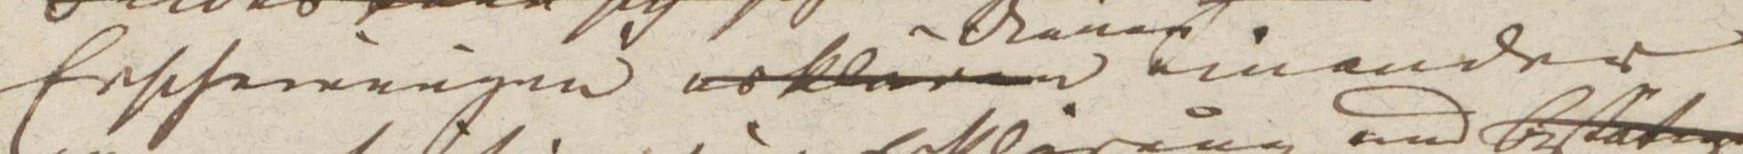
Erscheinungen erklären dienen einander
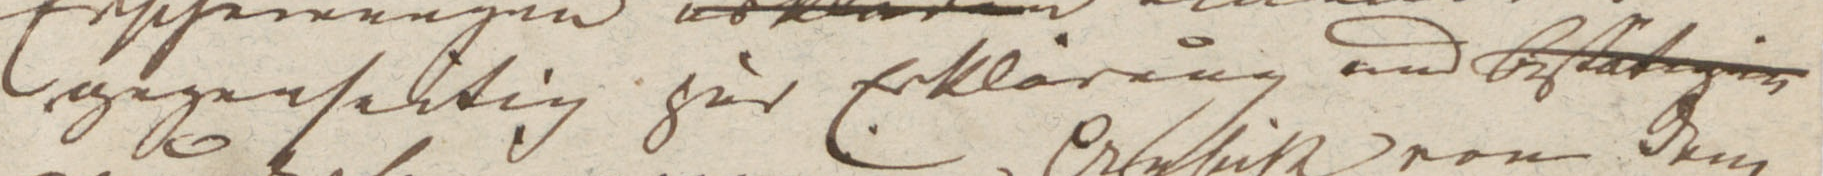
gegenseitig zur Erklärung und bestätigen
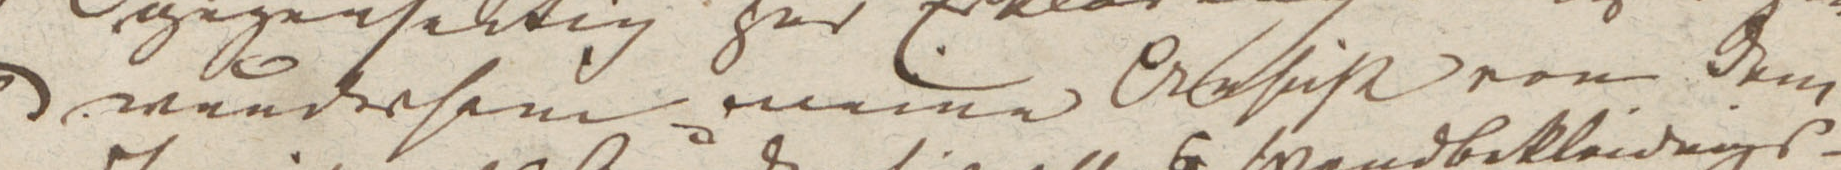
wundersam meine Ansicht von dem
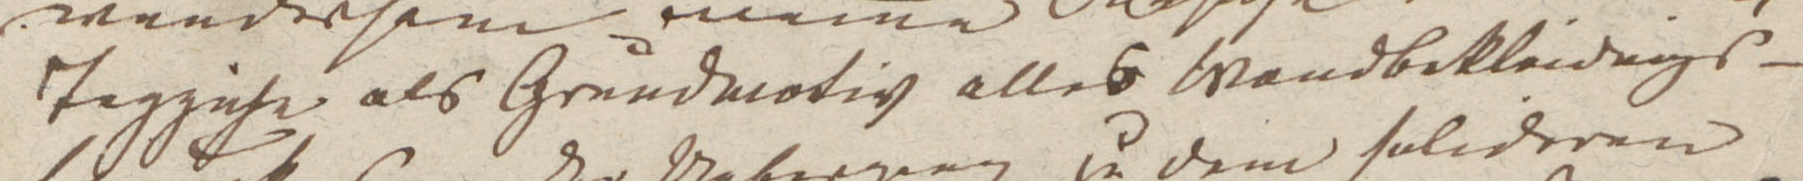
Teppiche als Grundmotiv allers Wandbekleidungs-
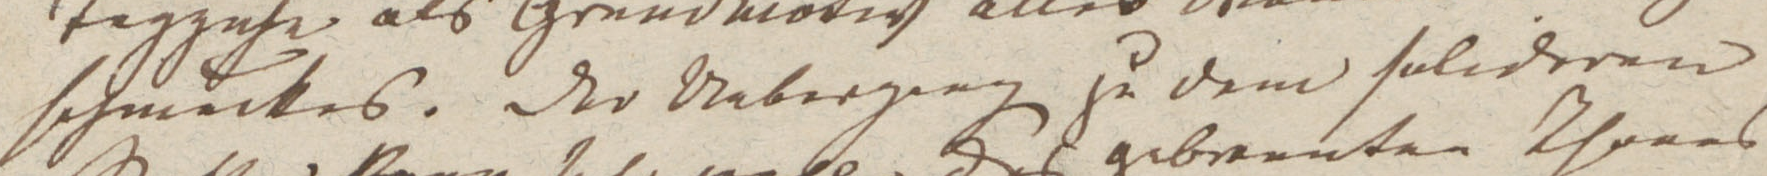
schmuckes. Der Uebergang zu dem solideren
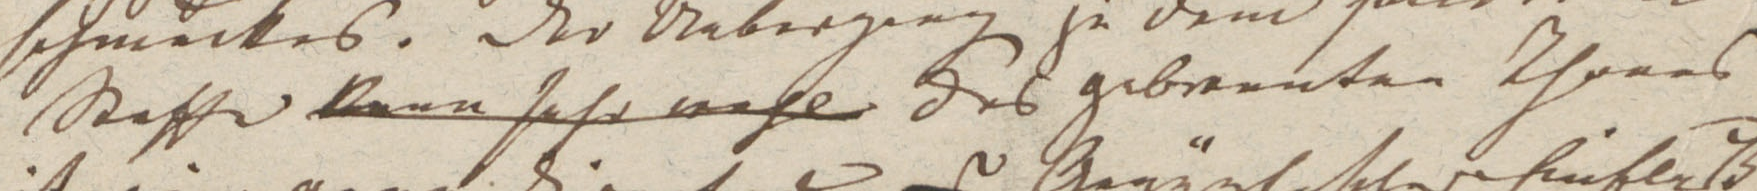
Stoffe kann sehr wohl des gebrannten Thones
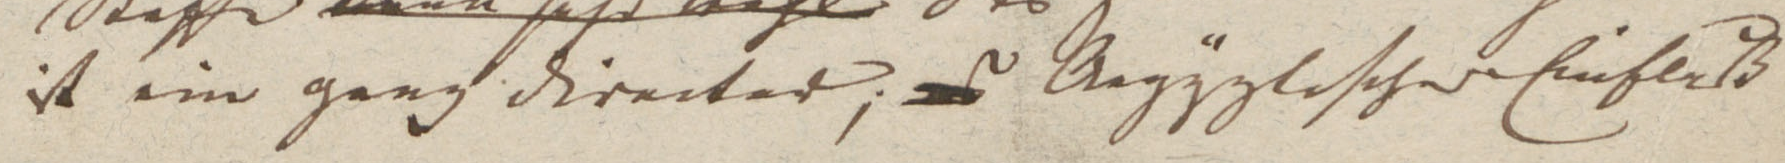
ist ein ganz directer; es Aegyptischer Einfluss
